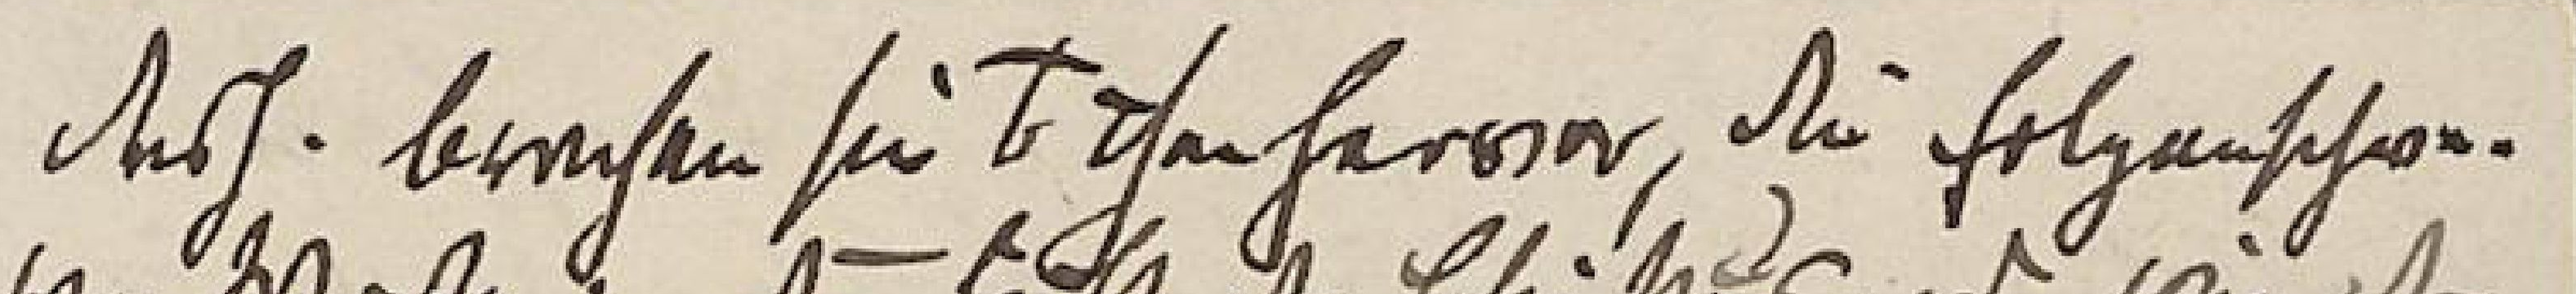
desh. brachen sie s ihm hervor, die folgenschwe¬
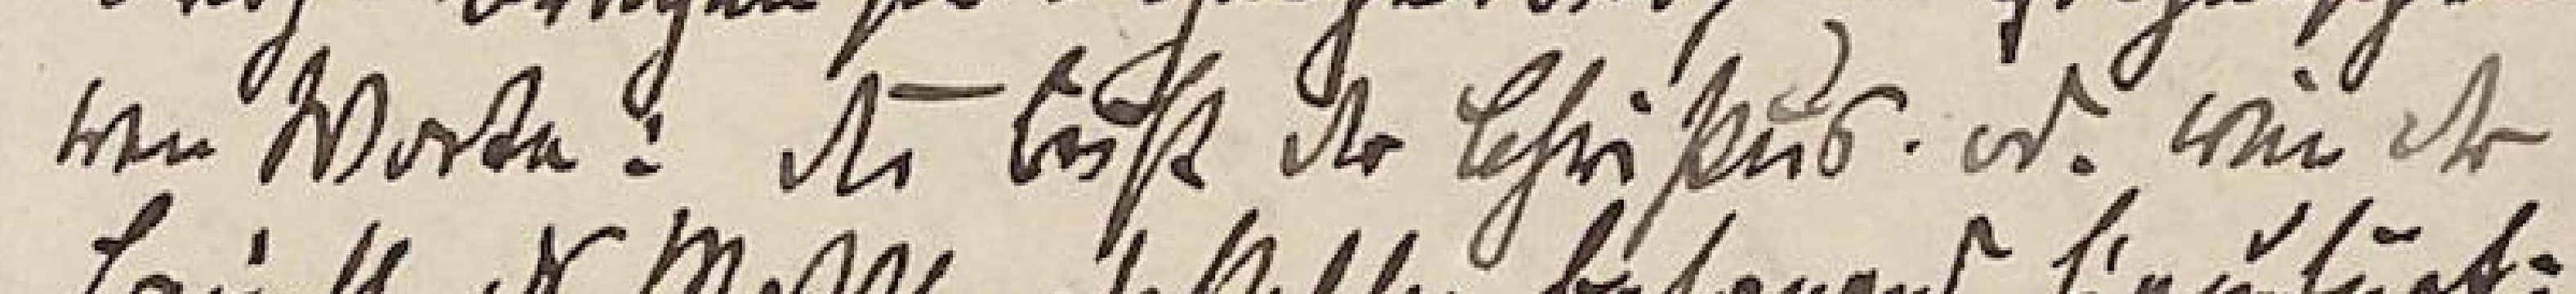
ren Worte: Du bist der Christus. od. wie dr
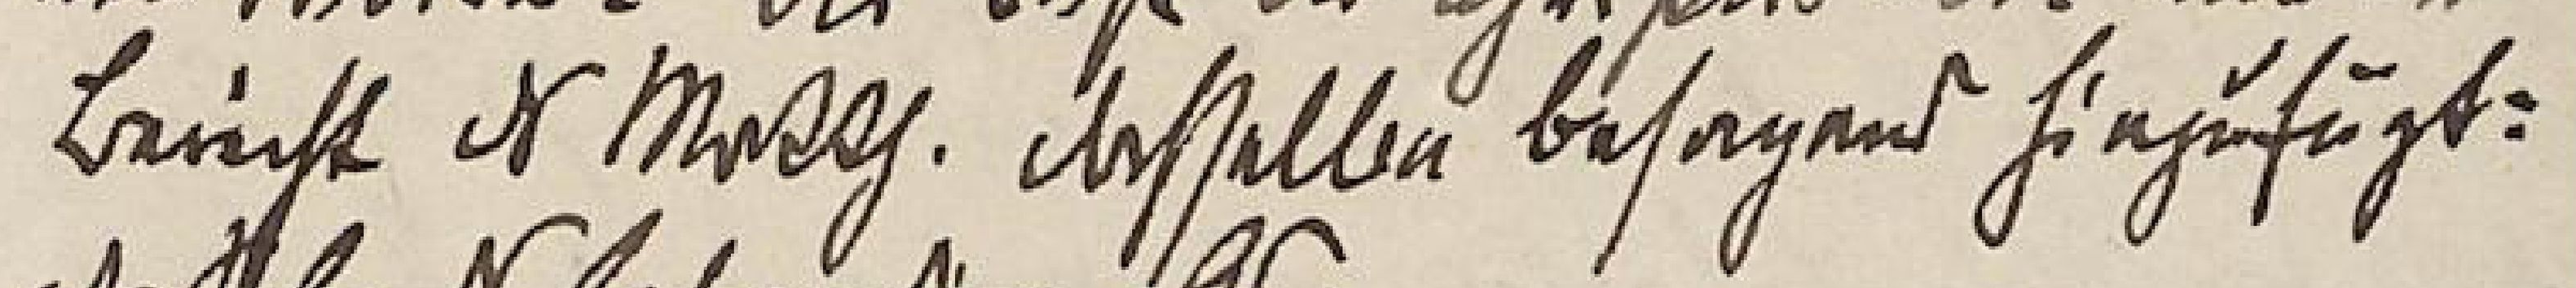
Bericht ds Matth. dasselbe besagend hinzufügt:
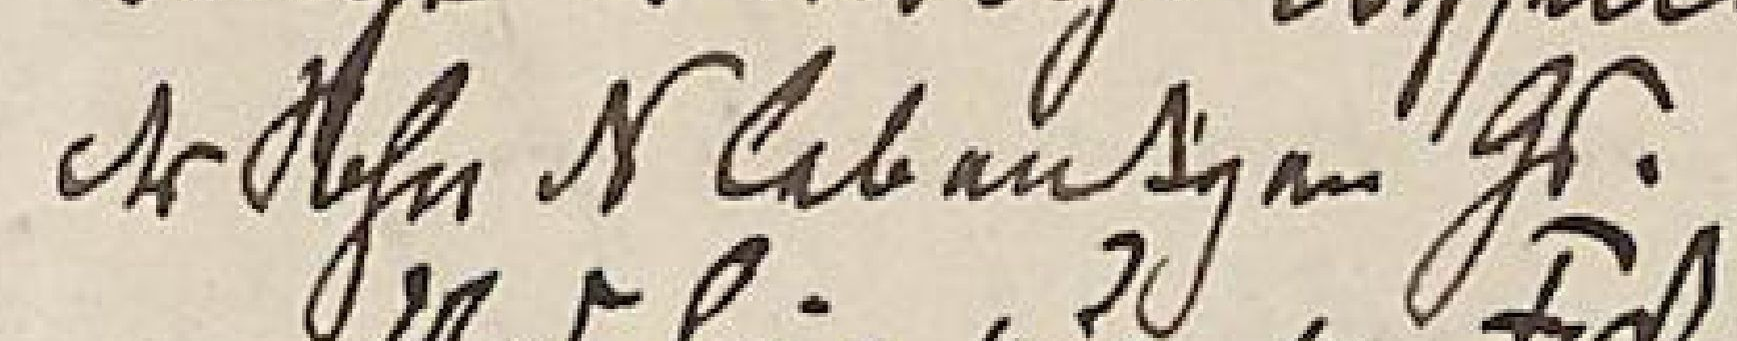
dr Sohn ds lebendigen Gs.
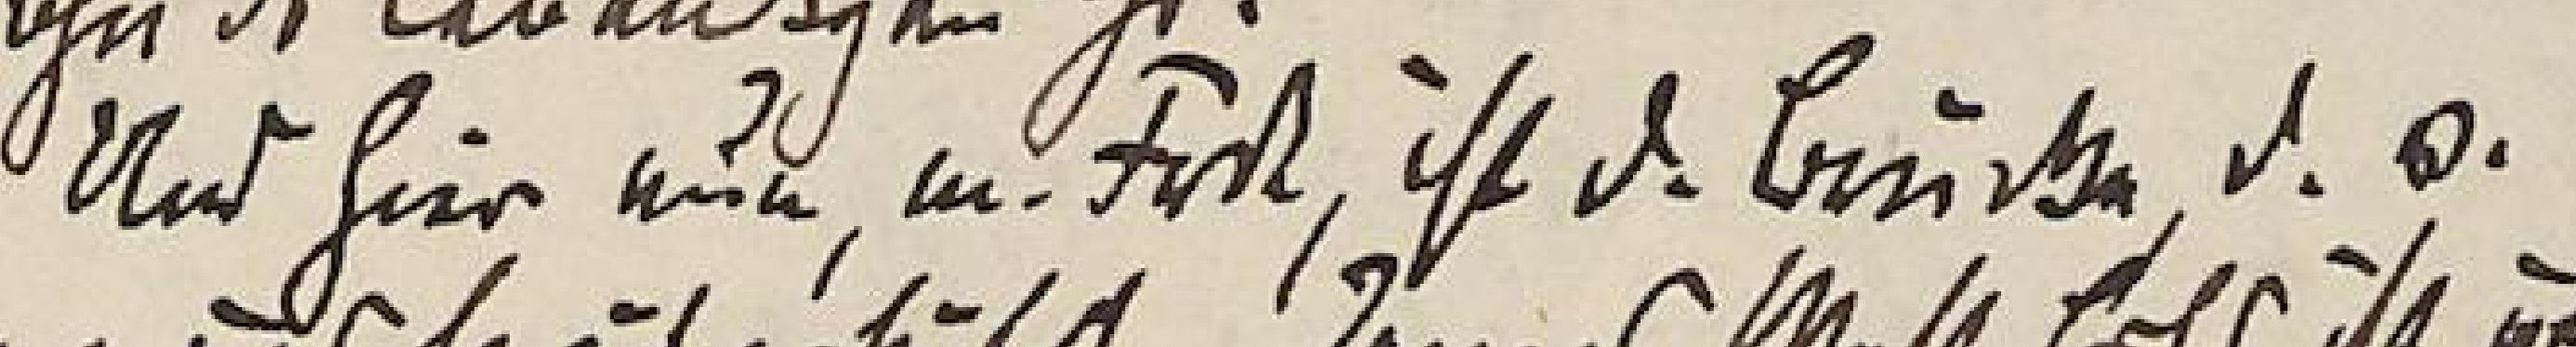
Und hier nun, m. Frd. ist d. Brücke d. v.
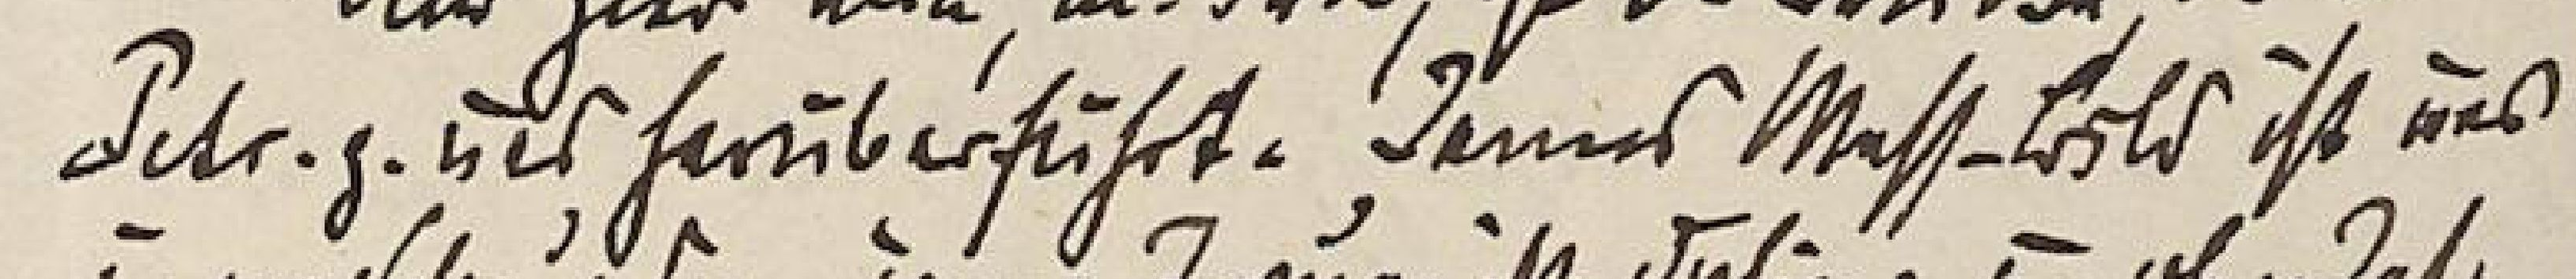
Petr. z. uns herüberführt. Jenes Mess-Bild ist uns
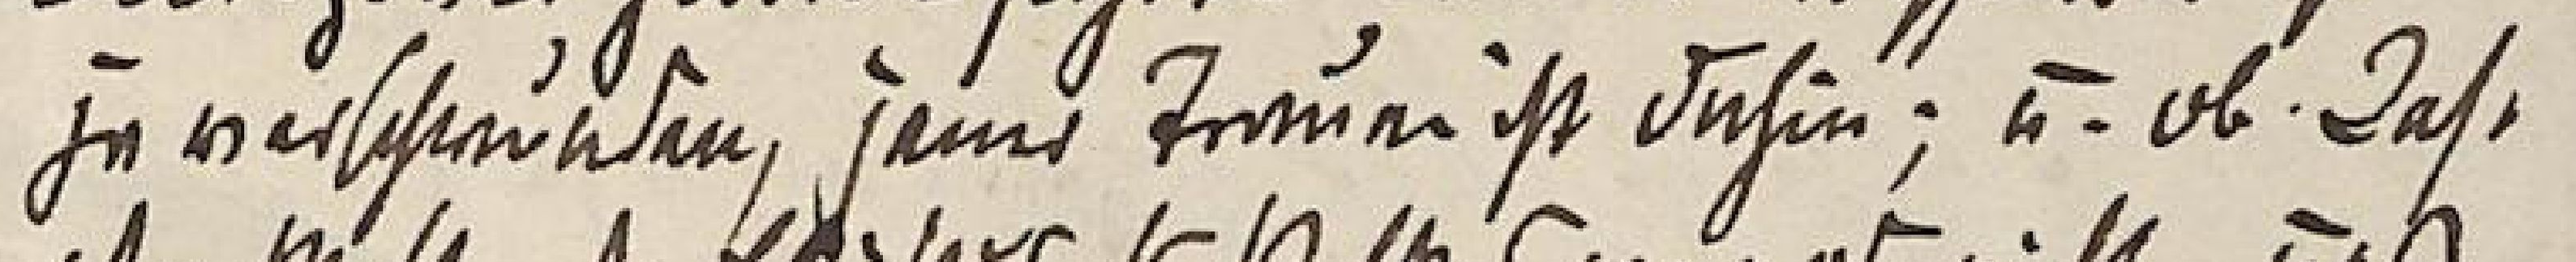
ja verschwunden, jener Traum ist dahin; u. ob. Jes.
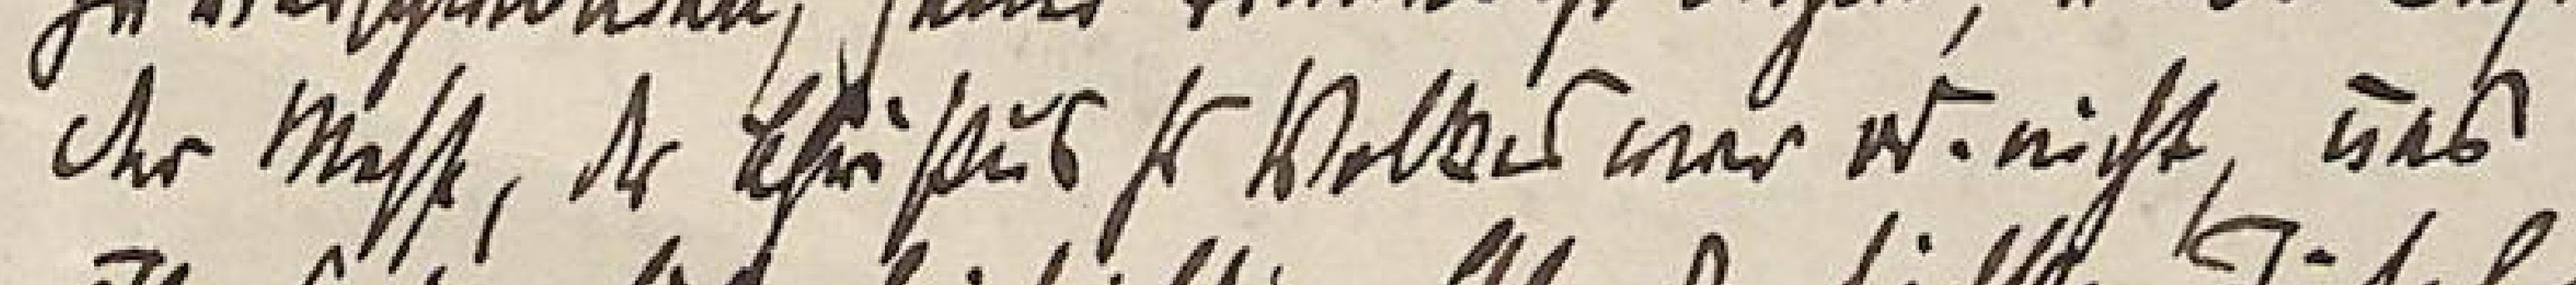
der Mess, der Christus ss Volkes war od. nicht, uns
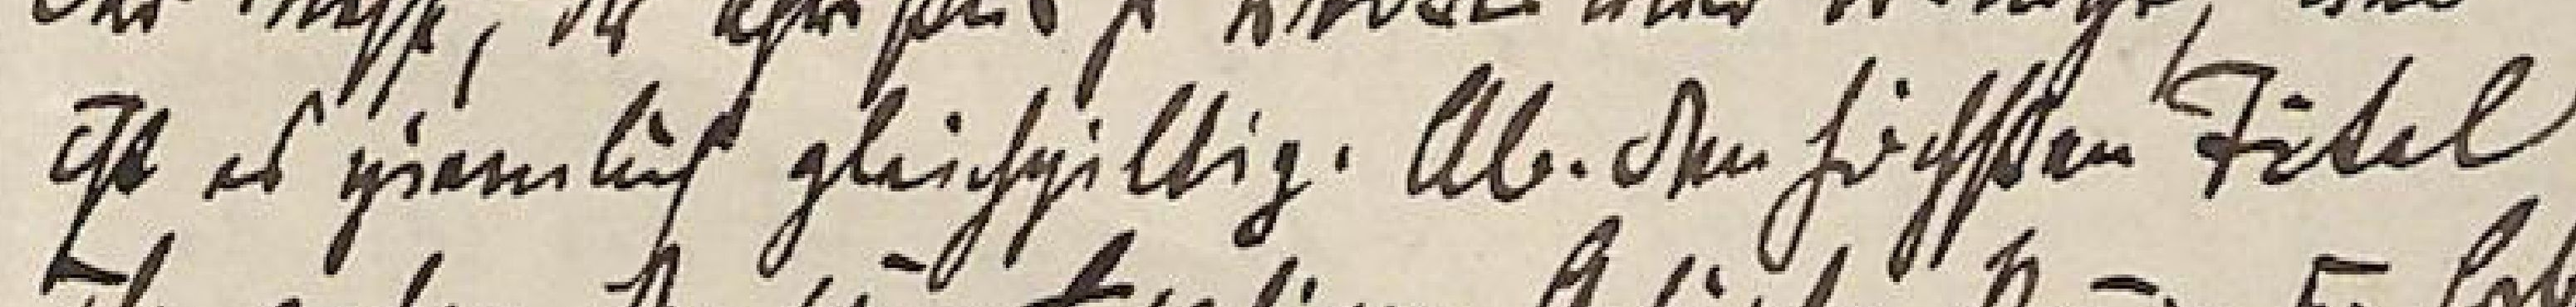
ist es ziemlich gleichgültig. Ab. den höchsten Titel
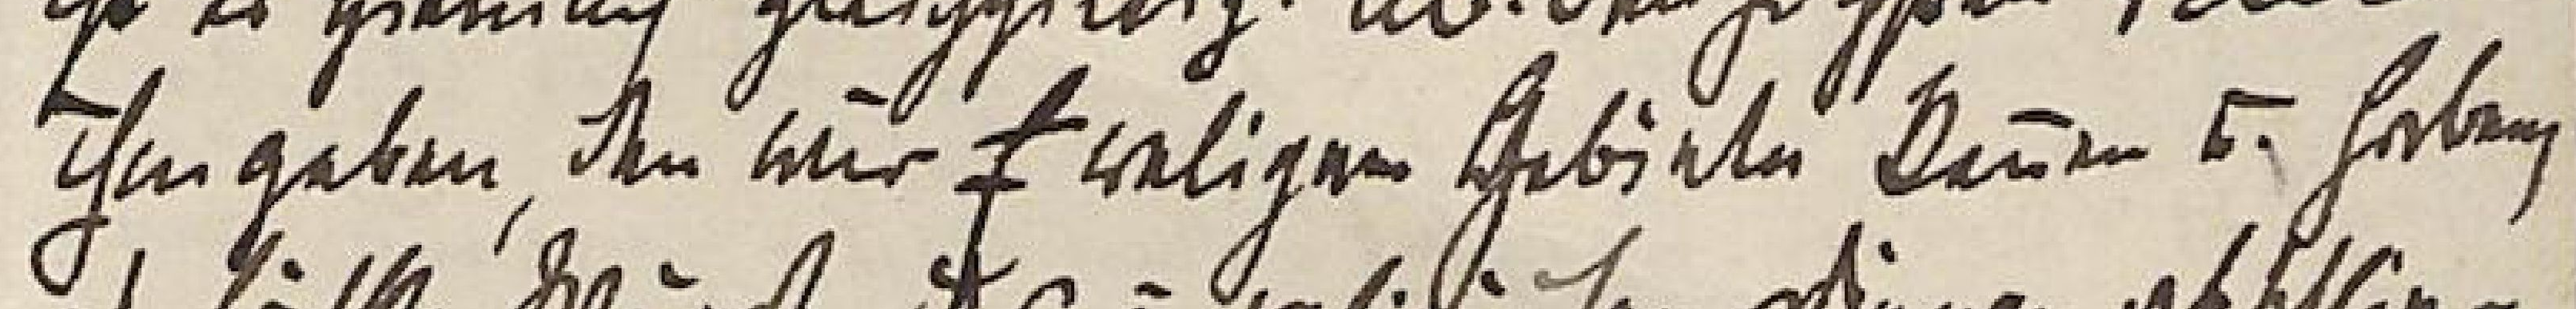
ihm geben, den wir f. religem Gebiete kenen u. haben,
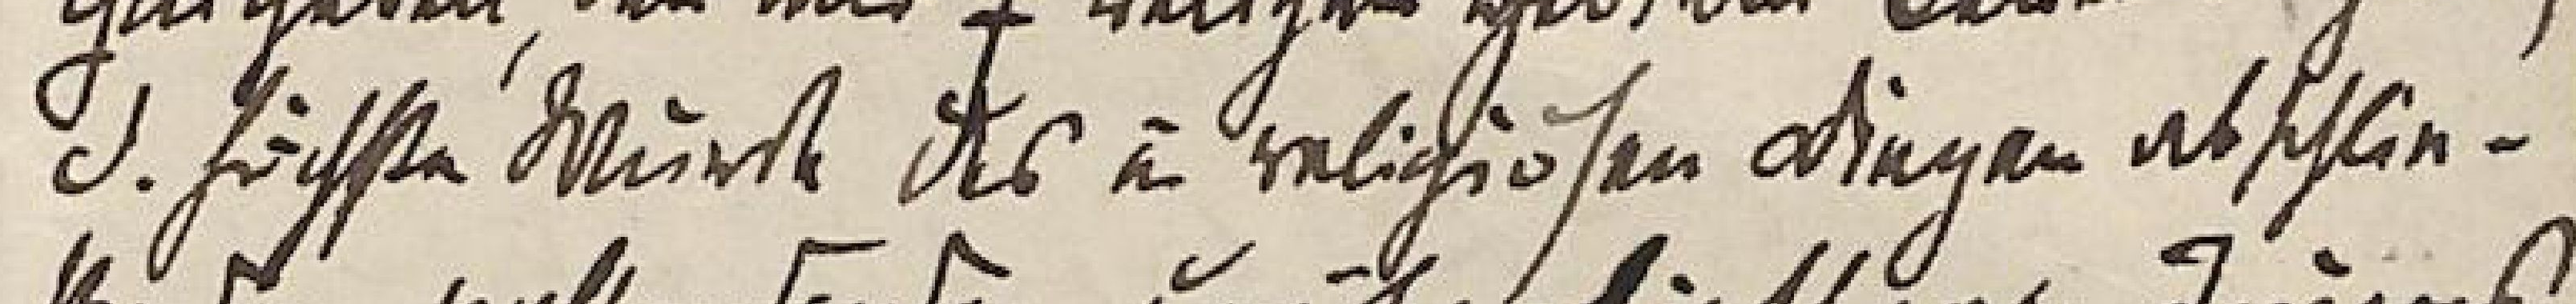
d. höchste Würde des in religiösen Dingen abschlie¬
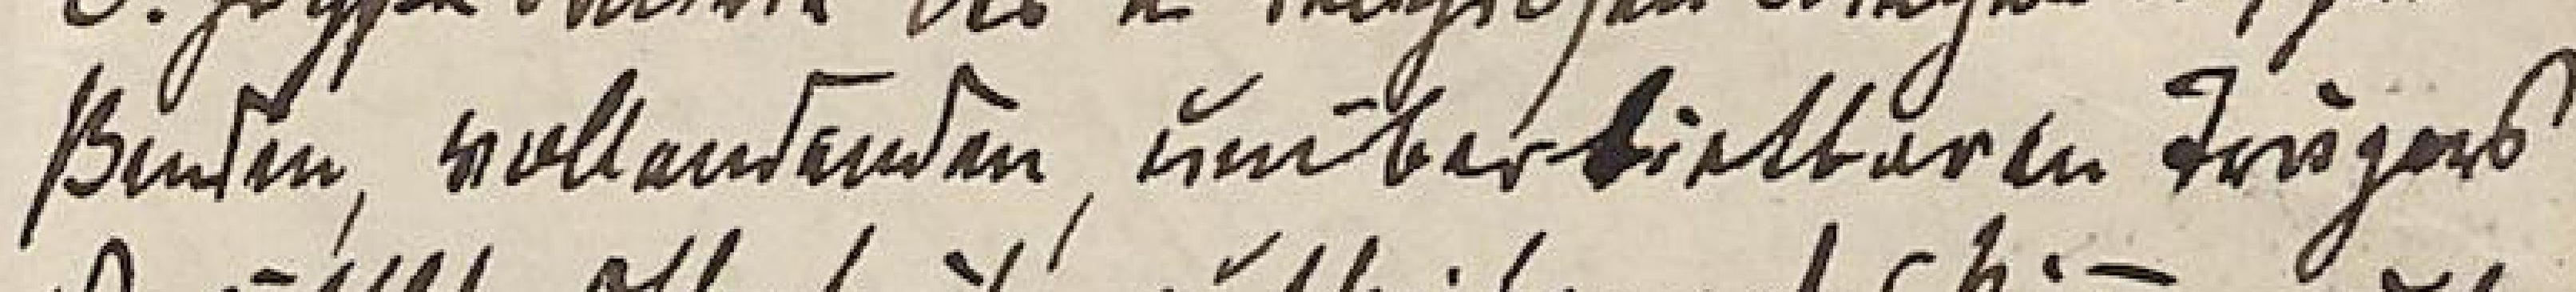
ßenden, vollendenden, unpberbietbaren Trägers
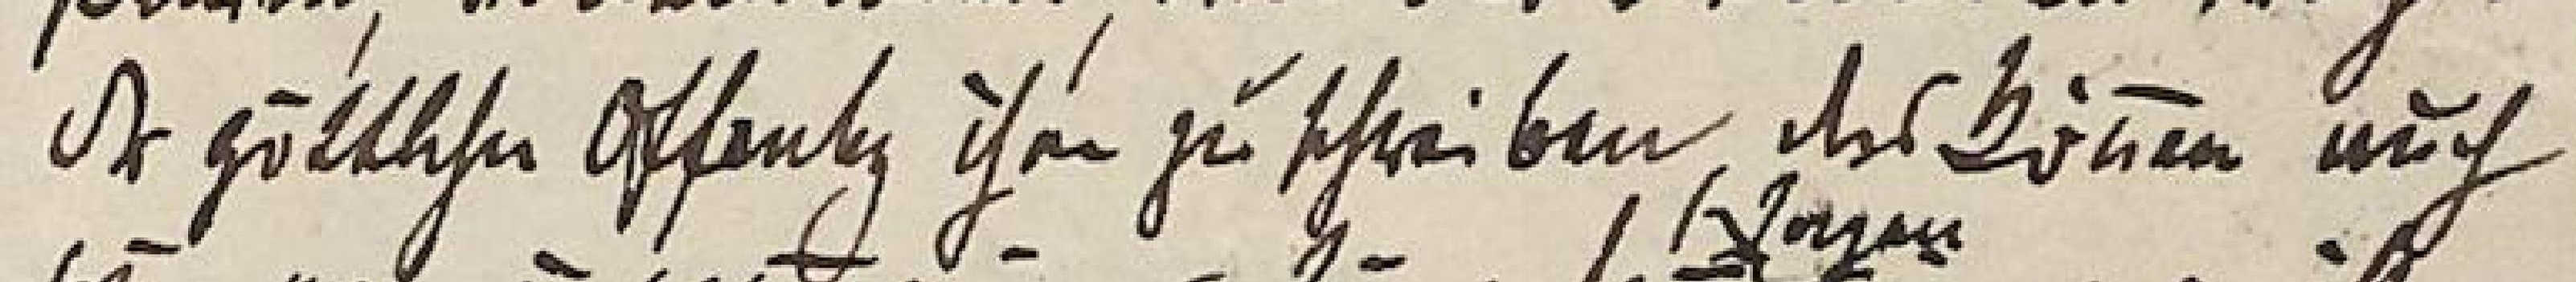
der göttlichen Offenbg ihm zuschreiben, das könen auch
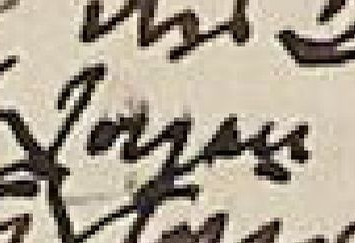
sagen
